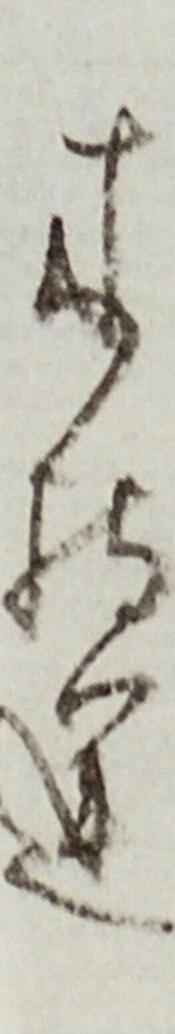木持運
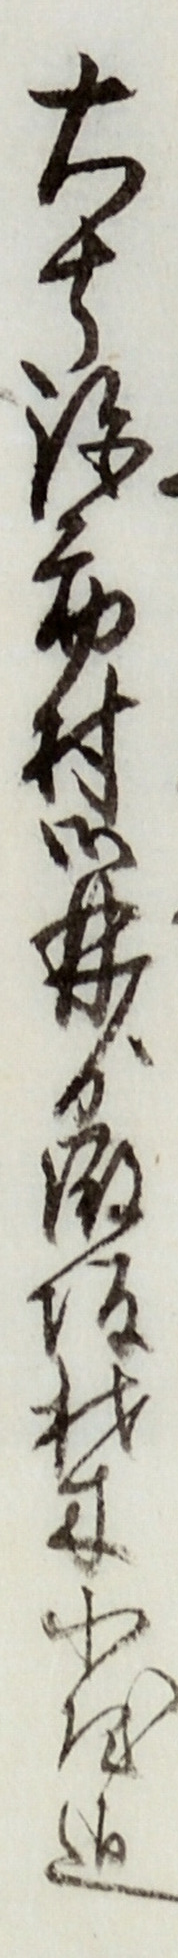右者弥勒村御林ゟ殿坂材木小屋迄
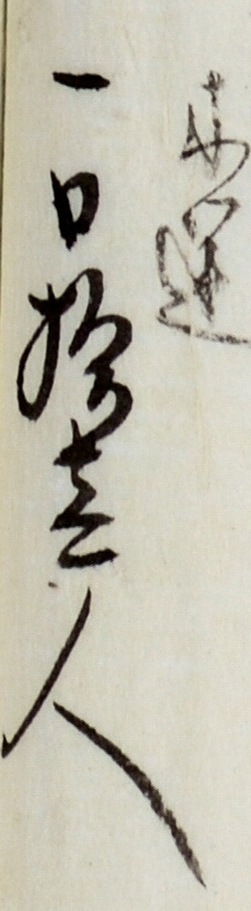一同拾壱人
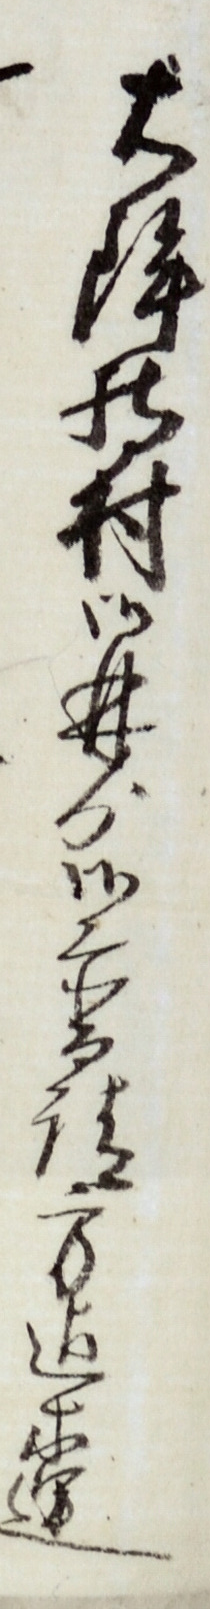右者板町村御林ゟ御普請方迄木運

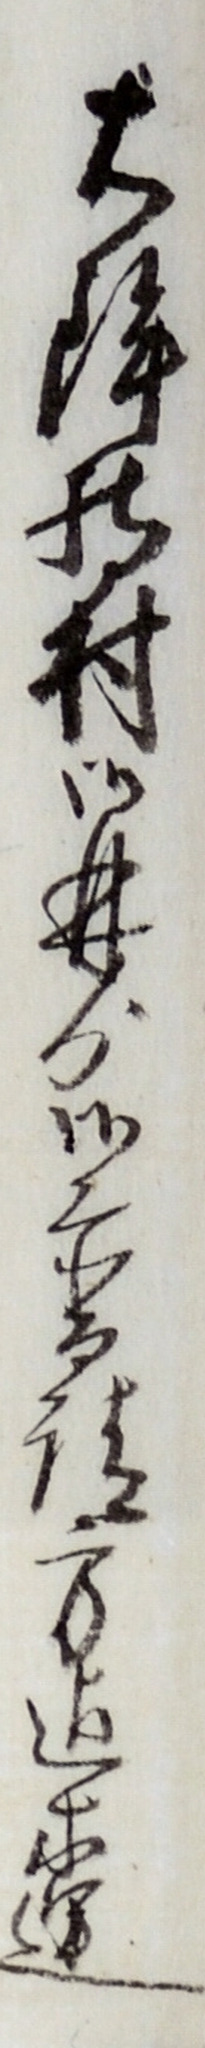右鉾持村御林ゟ御普請方迄木運
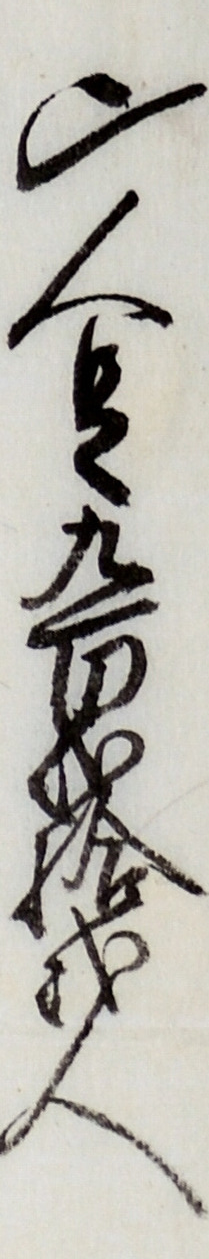〆人足九百弐拾弐人
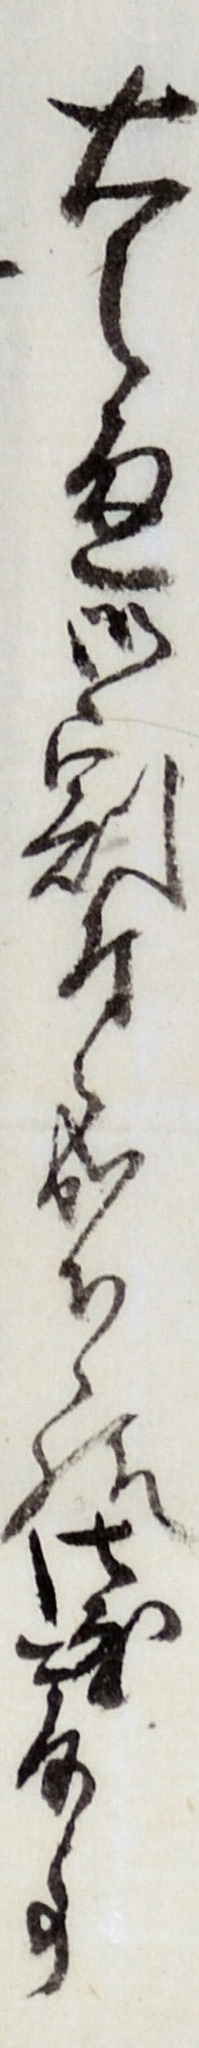右之通御割付被成下候様仕度奉存候事
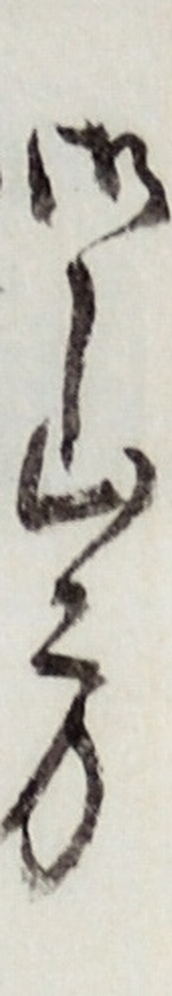御薪方
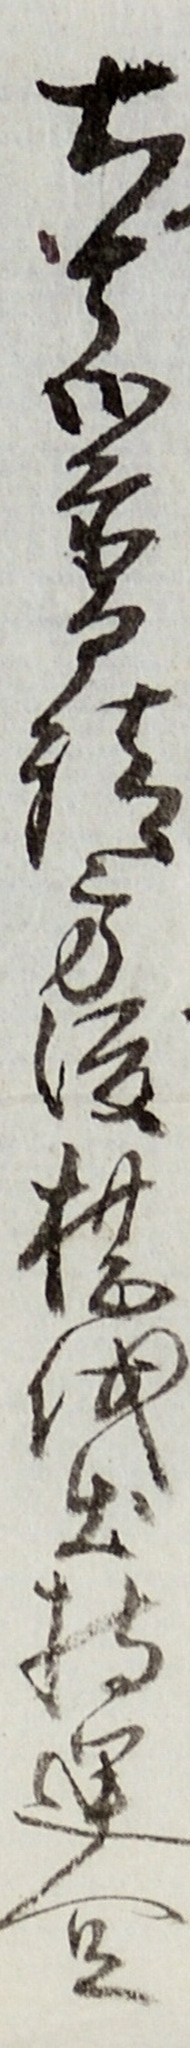右者御普請方渡椹伐出持運人足
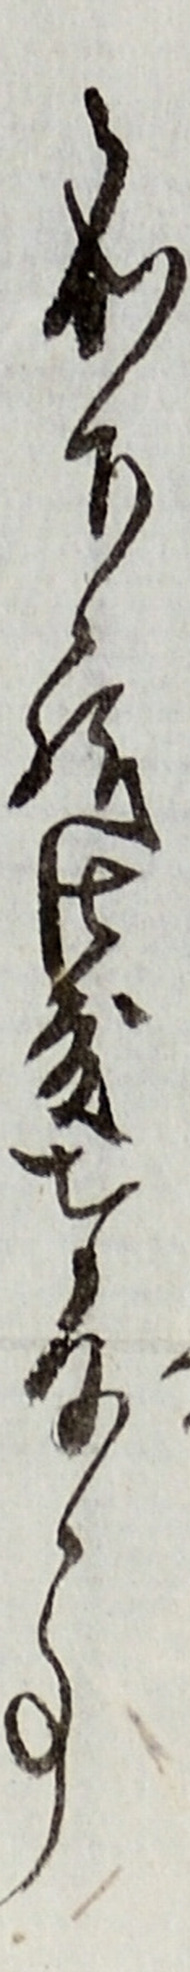被成下候様仕度奉存候事
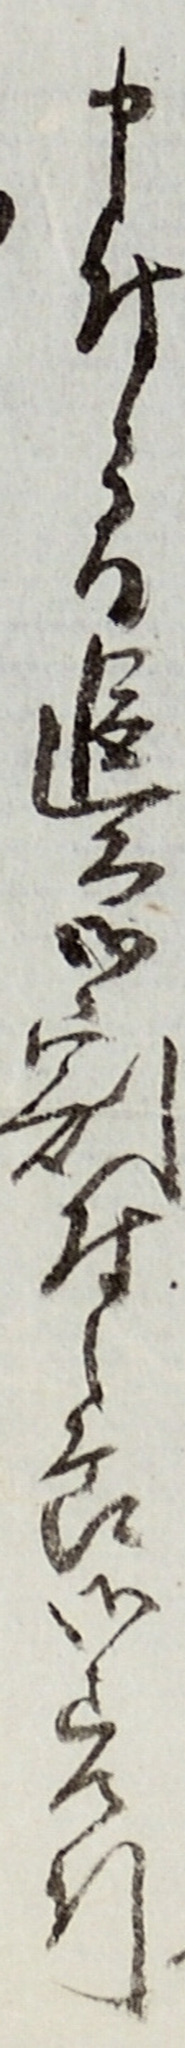申付候間追而御割付之節御差引
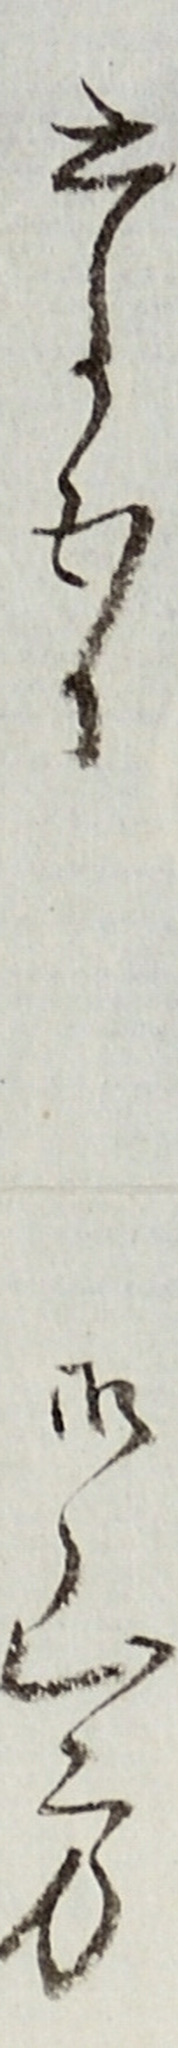六月五日御山方
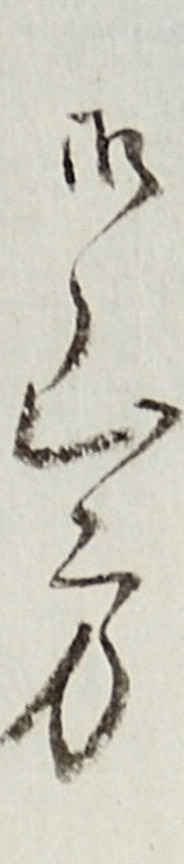御薪方
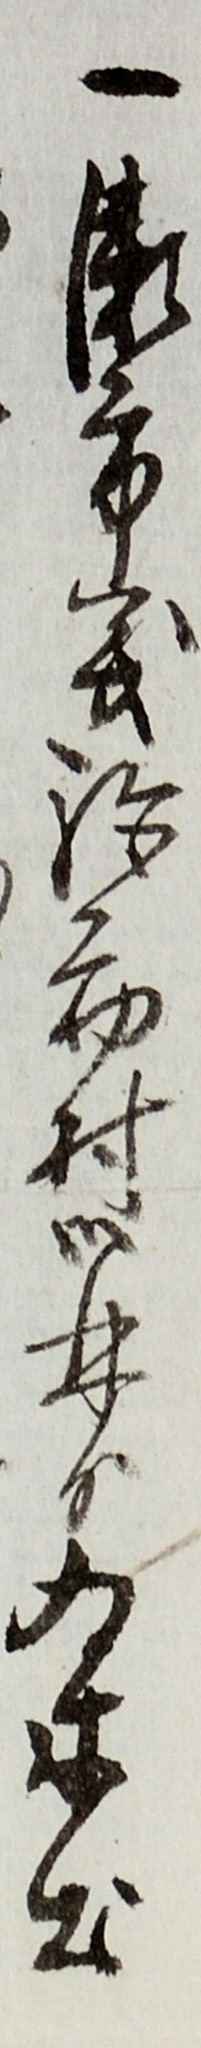一瀬市義弥勒村御林ゟ為木出
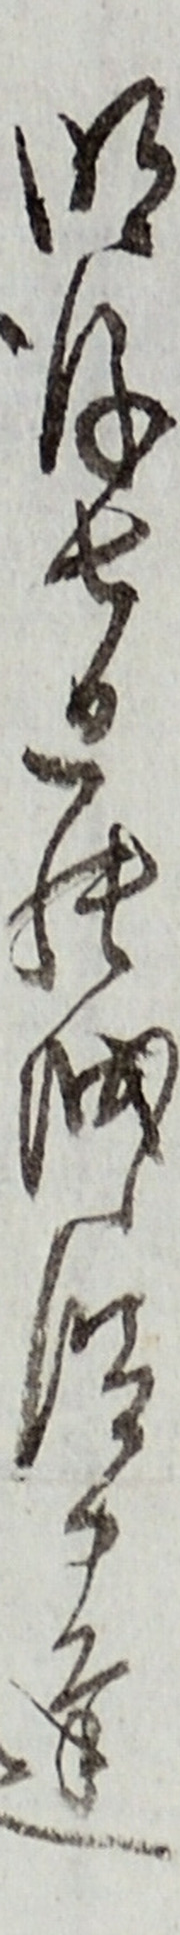明後七日罷越候段申達
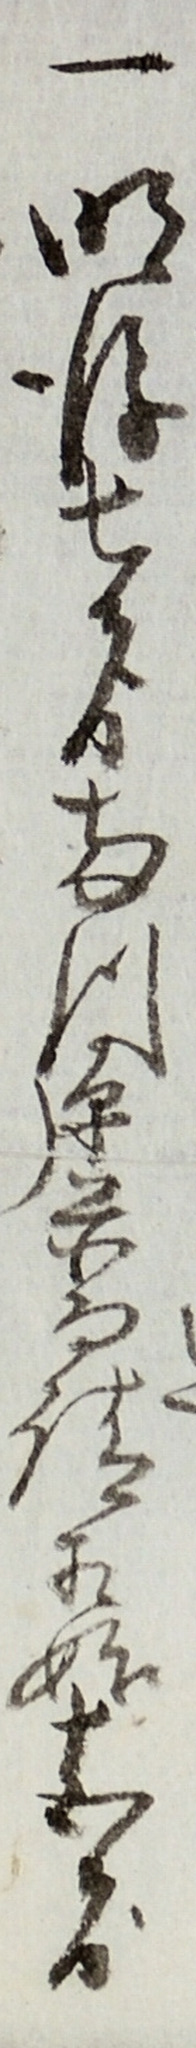一明後七日ゟ両川原普請相始十五日ゟ
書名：御山方御薪方諸事御用留
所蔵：伊那市立高遠町図書館・合同会社AMANE
